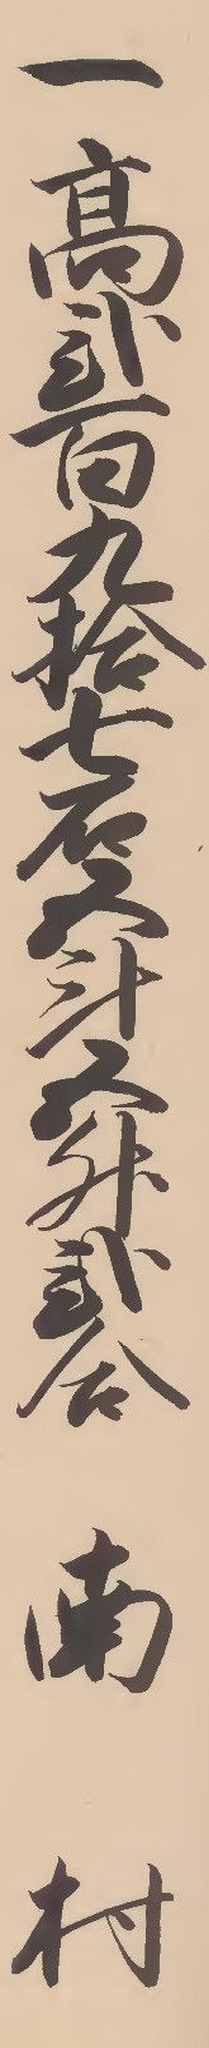一高弐百九拾七石五斗五升弐合南村
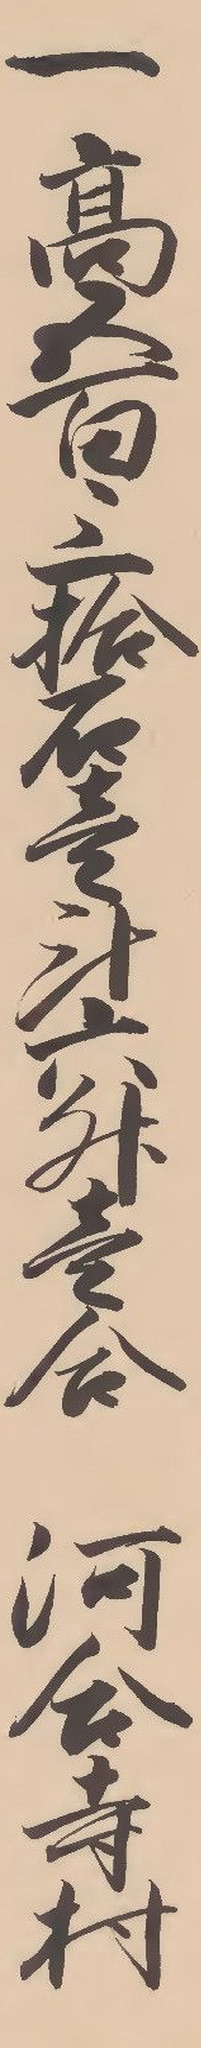一高五百三拾石壱斗六升壱合河合寺村
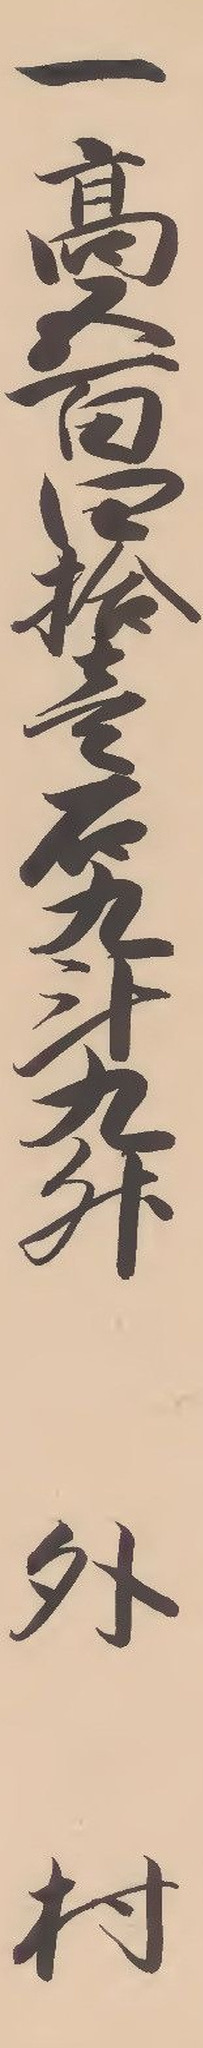一高五百四拾壱石九斗九升外村
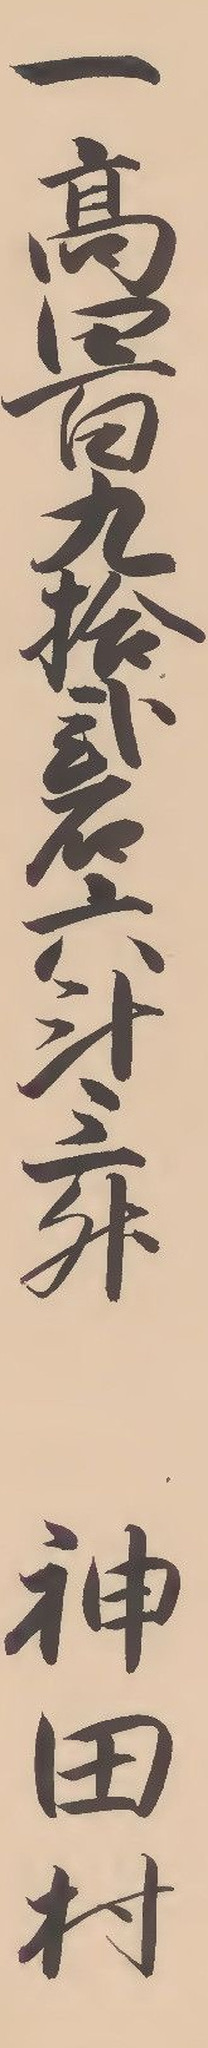一高四百九拾弐石六斗三升神田村

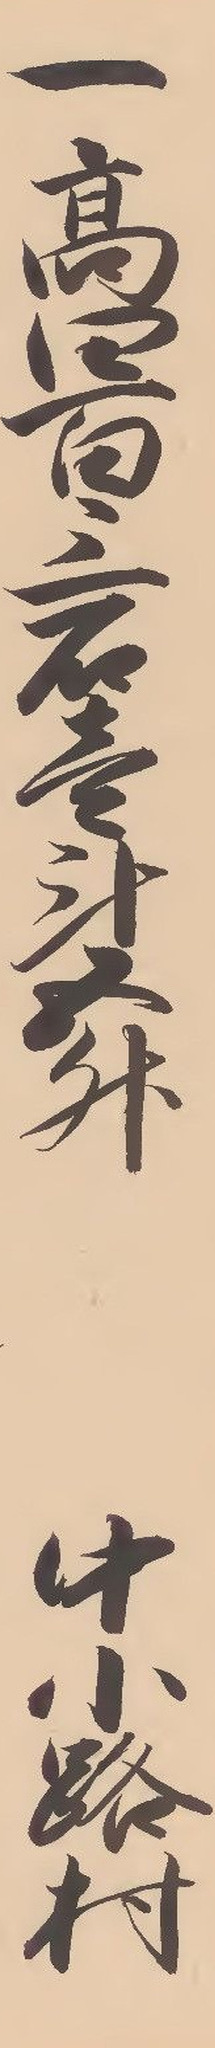一高四百三石壱斗五升中小路村
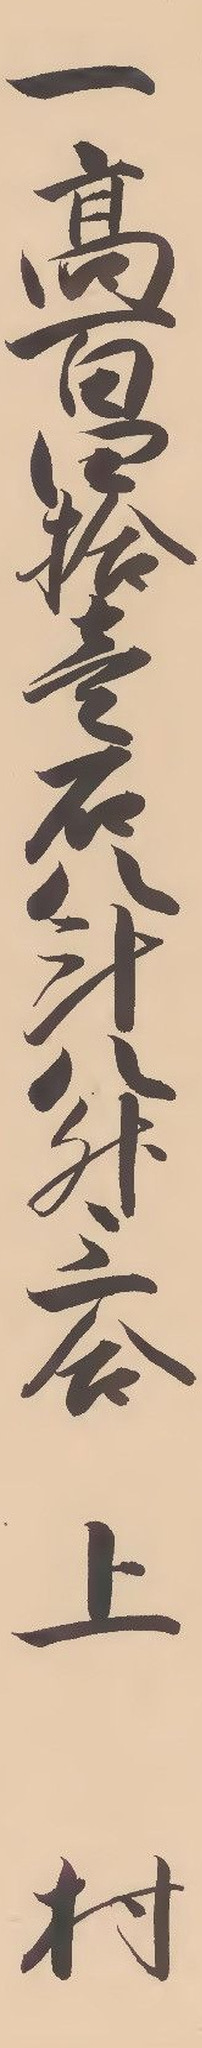一高百四拾壱石八斗八升三合上村
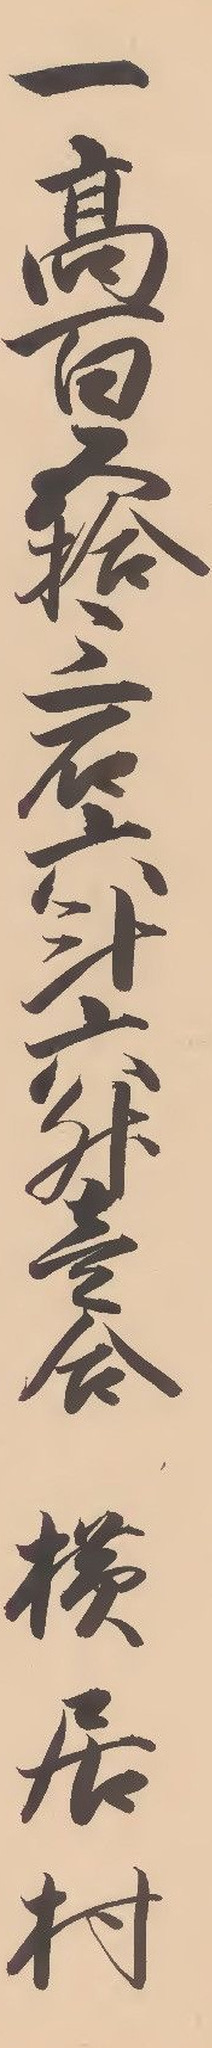一高百五拾三石六斗六升壱合横居村
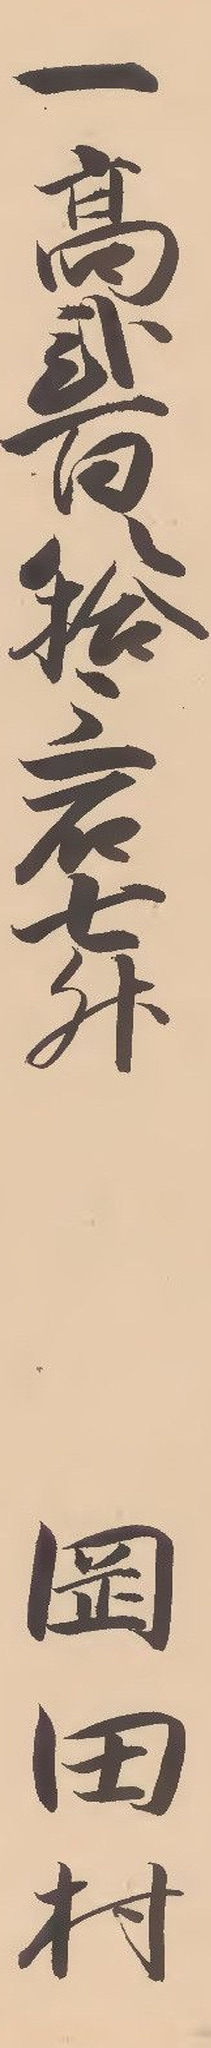一高弐百八拾三石七升岡田村
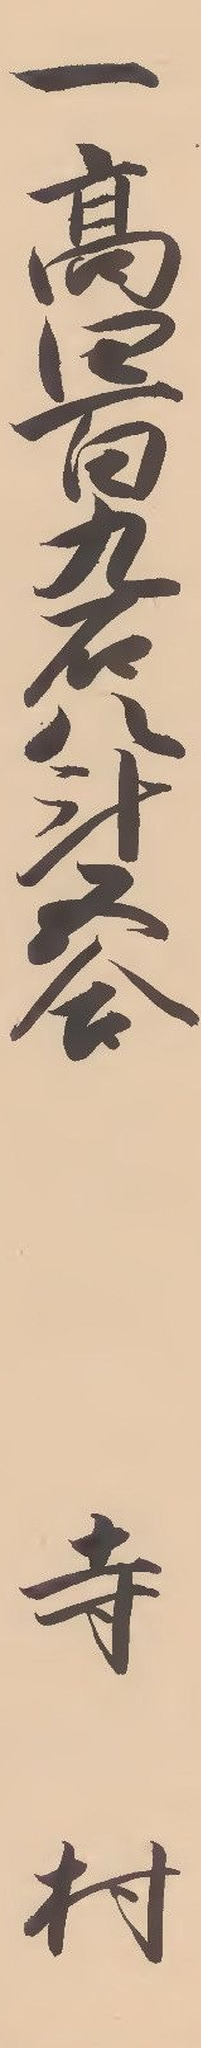一高四百九石八斗五合寺村
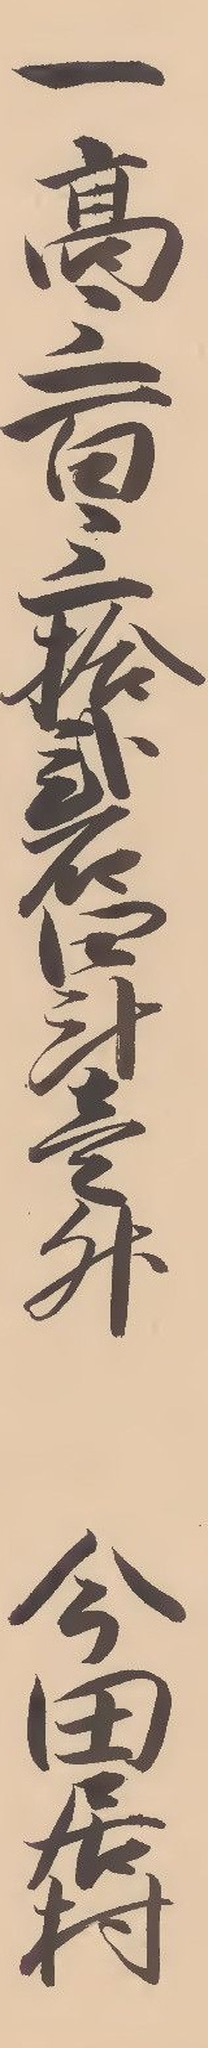一高三百三拾弐石四斗壱升今田居村
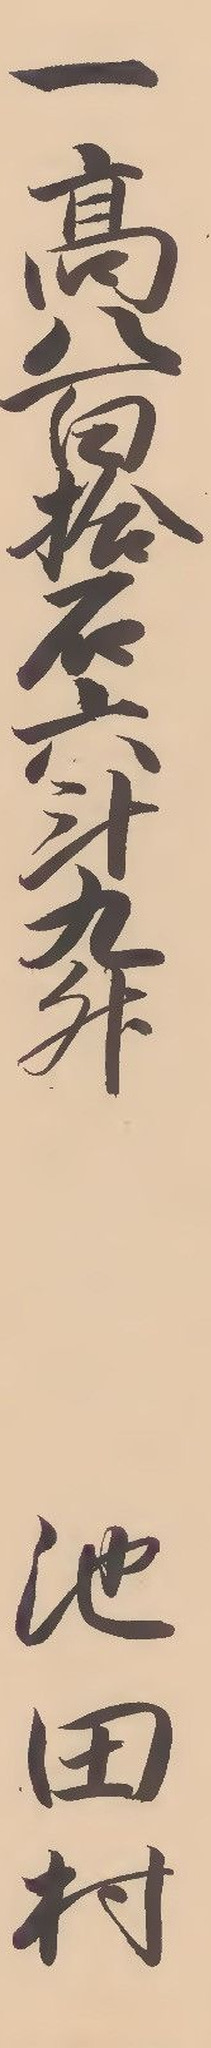一高八百拾石六斗九升池田村

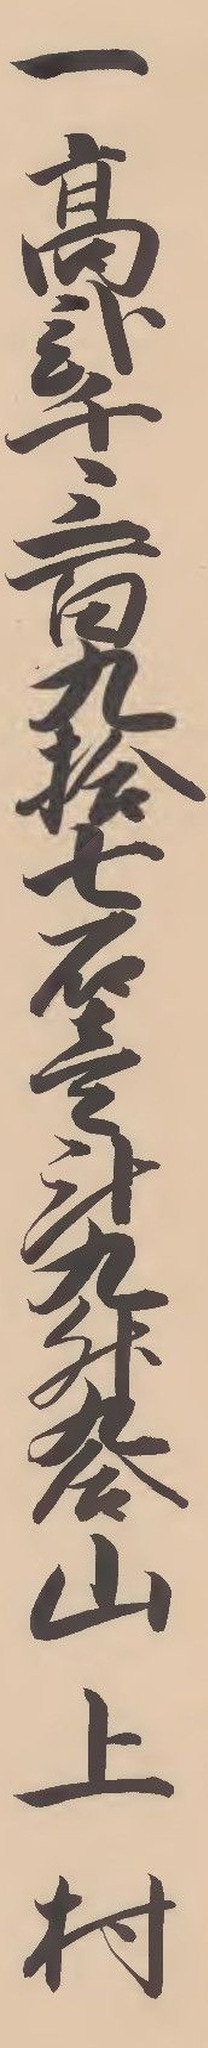一高弐千三百九拾七石壱斗九升九合山上村
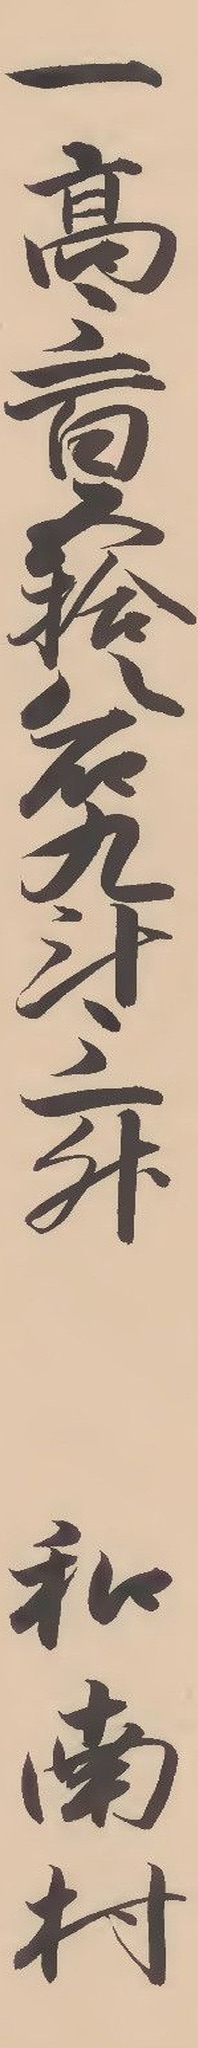一高三百五拾八石九斗三升和南村
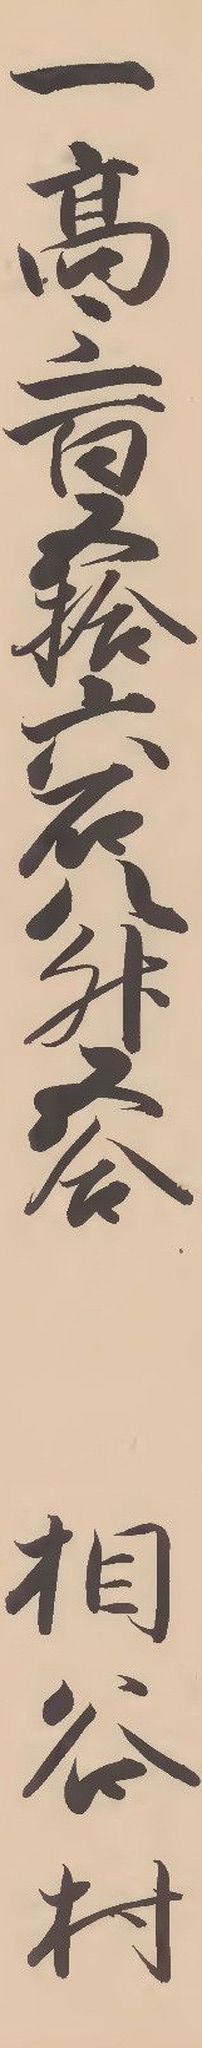一高三百五拾六石八升五合相谷村
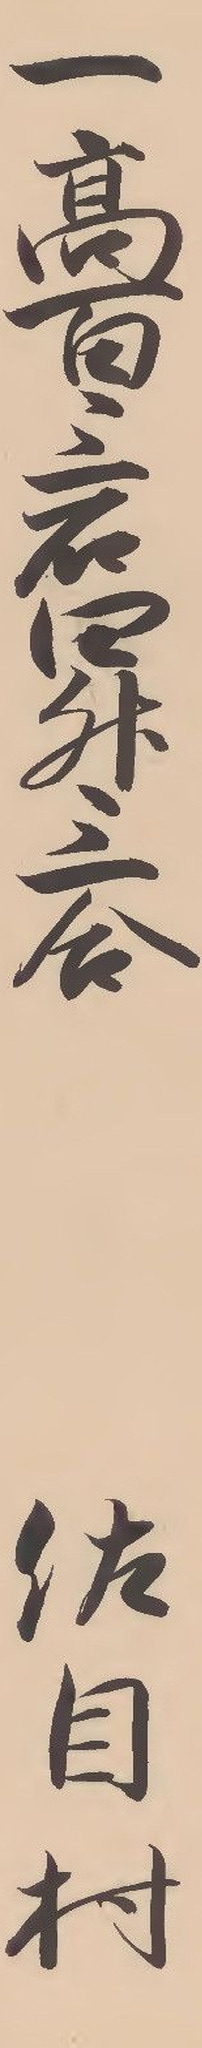一高百三石四升三合佐目村
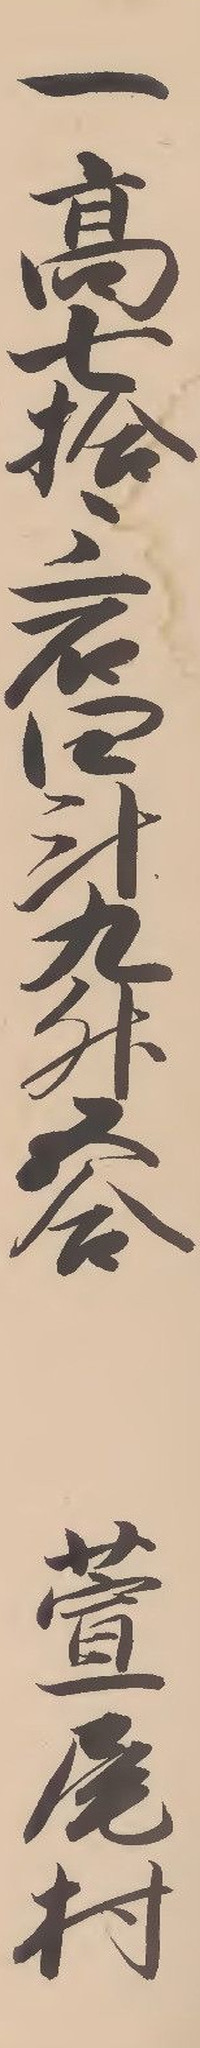一高七拾三石四斗九升五合萱尾村
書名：近江国郷帳
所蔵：国立公文書館 National Archives of Japan
